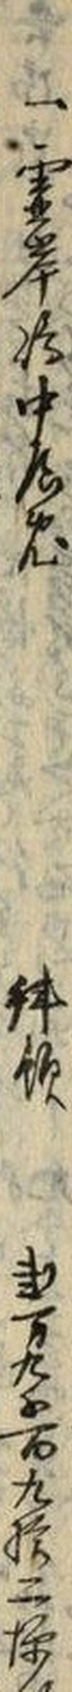一霊岸嶋中屋敷拝領弐万九千百九拾二坪余
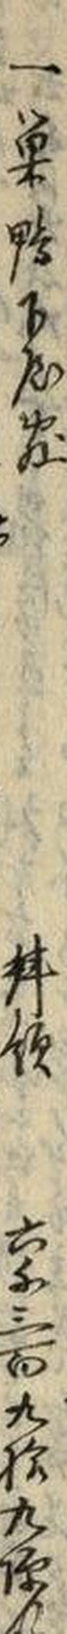一巣鴨下屋敷拝領六千三百九拾九坪余
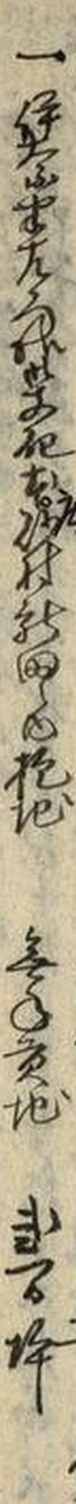一伊奈半左衛門様御支配本庄砂村新田之内抱地無年貢地弐万坪
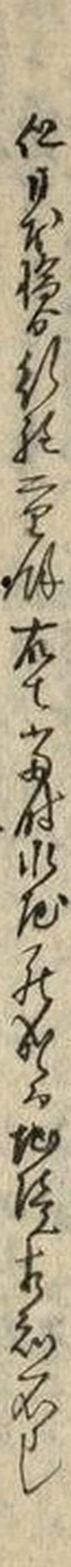但日本橋ゟ行程二里余右者当時水屋罷成候而地境相知不申候
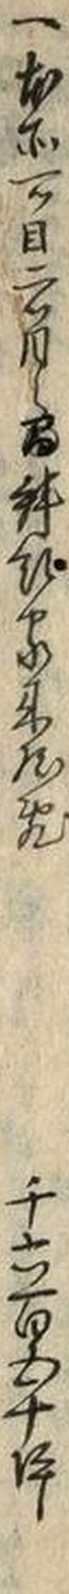一本所一ツ目二ツ目之間拝領家来屋敷千六百五十坪
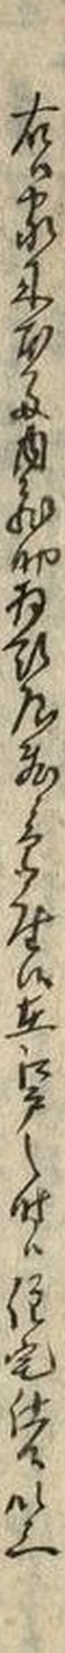右ハ家来本多内蔵助拝領屋敷ニ而御座候在江戸之時ハ住宅仕候以上
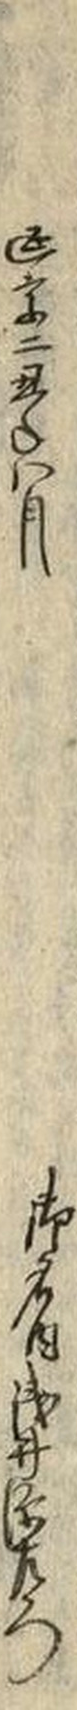延享二丑年八月御名内浅井源左衛門
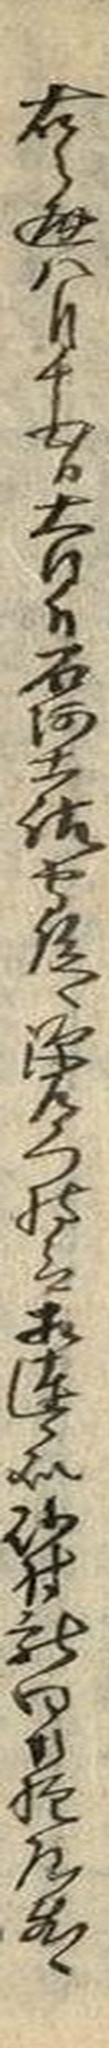右之通八月十五日大目付石河土佐守殿へ源左衛門持参相達候処砂村新田御抱屋敷へ
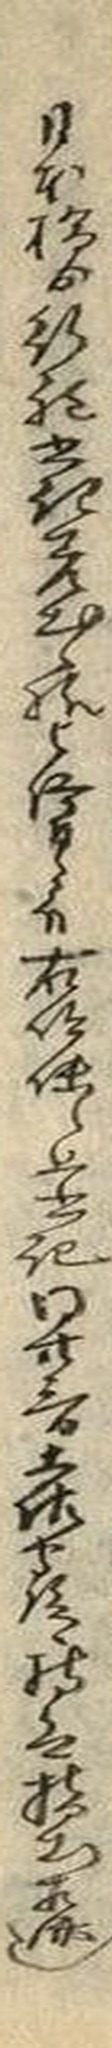日本橋ゟ行程書記差出候様被仰付候ニ付右吟味之上書記同廿三日土佐守殿へ持参指出相済也
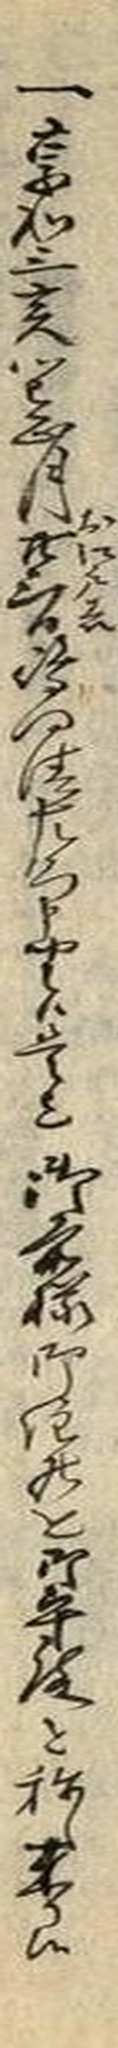一享和三亥閏正月於江戸表廿三日嶋田清左衛門申聞候ハ是迄御前様御住居を御守殿と称し来り候
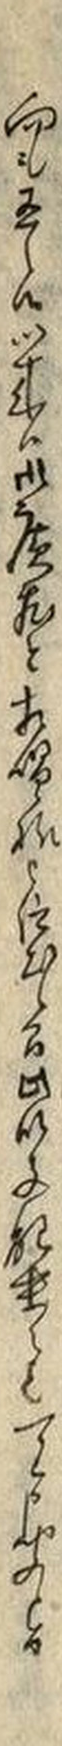向も有之候以来ハ御広敷と相唱候様被仰出候間此御支配末々迄可被申聞旨
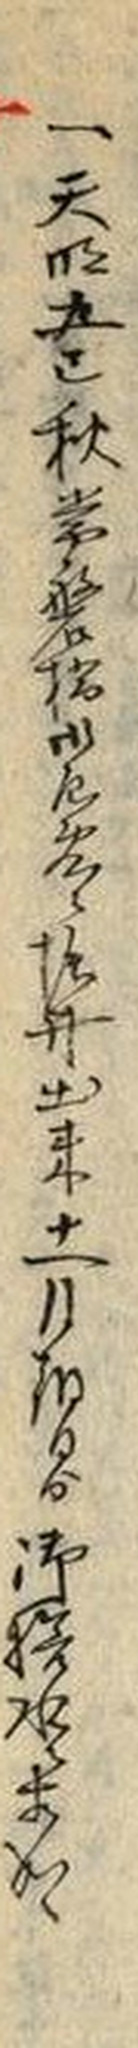一天明五巳秋常盤橋御屋敷ニ堀井出来十一月朔日ゟ御膳水ニ相成候

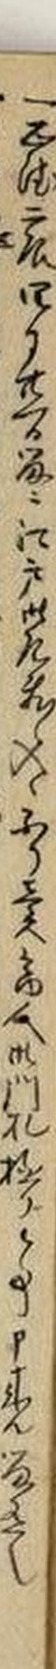一正徳二辰四月廿一日留ニ江戸御屋敷へ入候ふり売商人御門札極り候事申来ル留有之
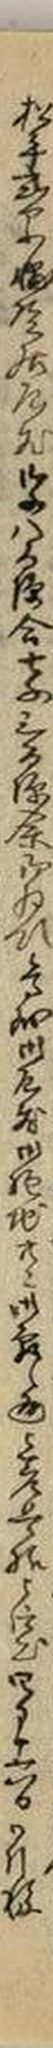松平式部少輔殿居屋敷弐千八百坪合七千三百坪余御拝領鳥越御屋敷御抱地共ニ御願之通被差上候様被仰出四月十六日御引移
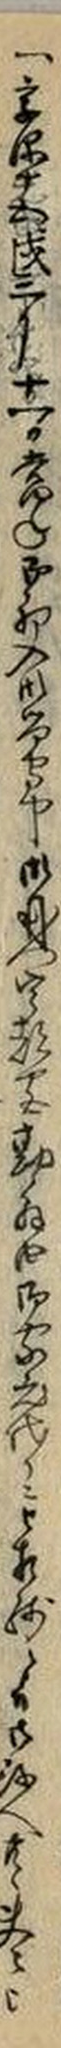一享保十五戌三月十一日当年御初入御留守中御用人宇都宮勘解由御家老代りニ被相残候ニ付御役人共へ夫々被
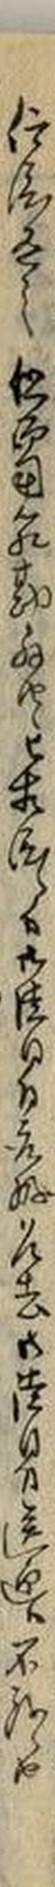仰渡有之但御用箱勘解由へ被相渡候ニ付御徒目付取扱乍去御徒目付送迎ハ不致候由
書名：御国他国諸事之部
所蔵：福井県文書館 Fukui Prefectural Archives
